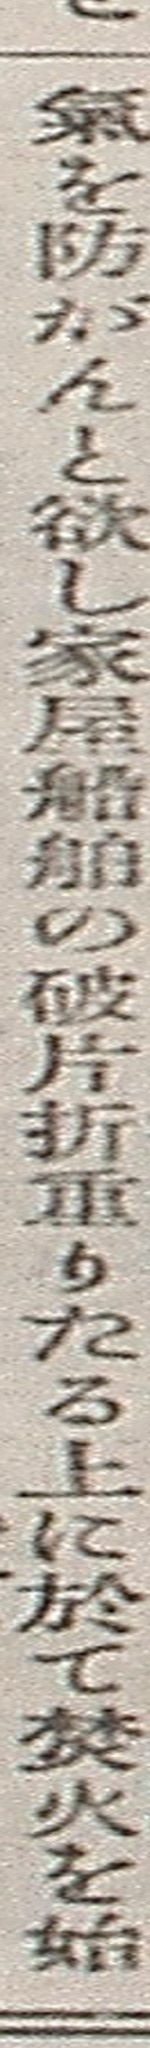気を防がんと欲し家屋船舶の破片折重りたる上に於て焚火を始
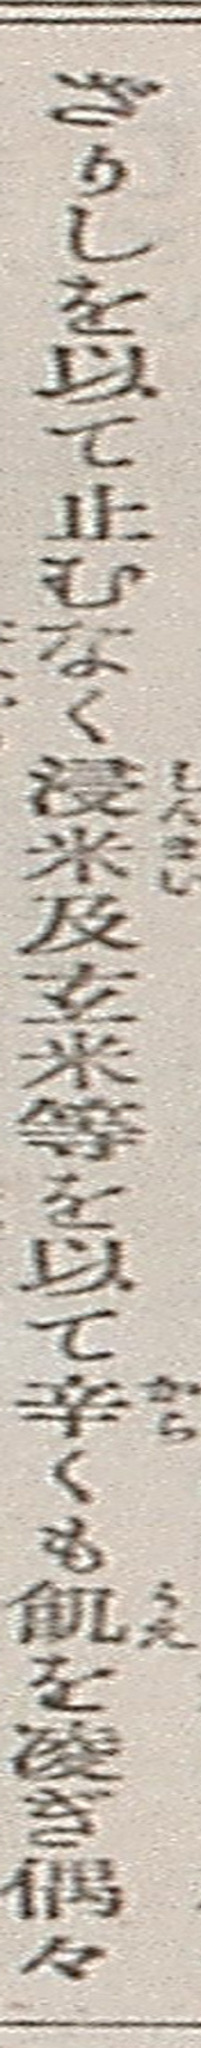ざりしを以て止むなく浸米及玄米等を以て辛くも飢を凌ぎ偶々
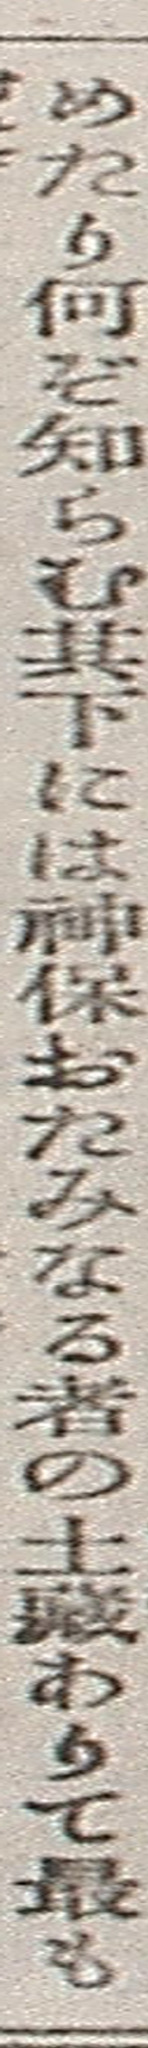めたり何ぞ知らむ其下には神保おたみなる者の土蔵ありて最も
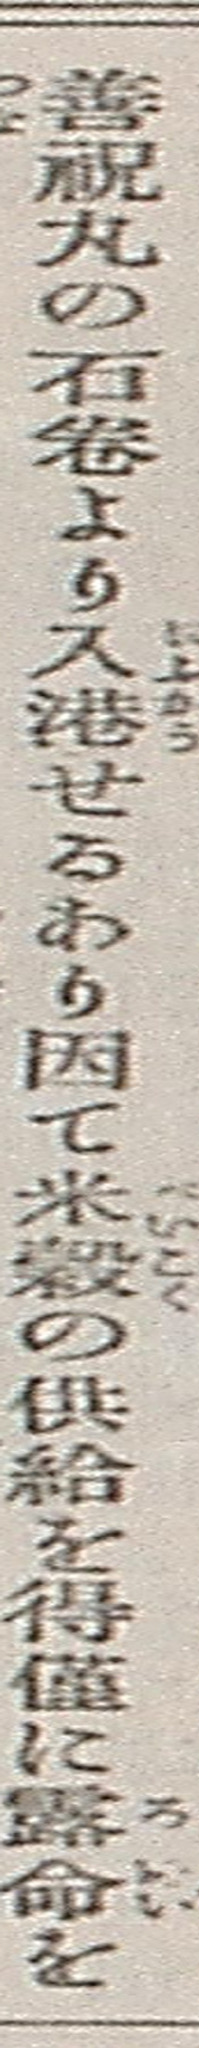義祝丸の石巻より入港せるあり因て米穀の供給を得僅に露命を
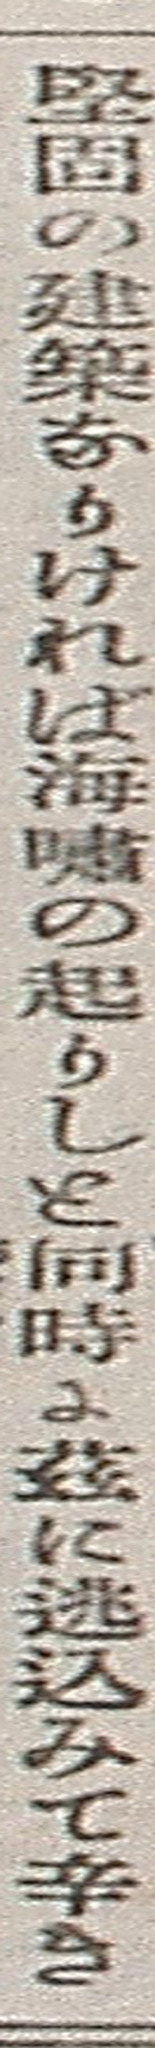堅固の建築なりければ海嘯の起りしと同時に茲に逃込みて辛き
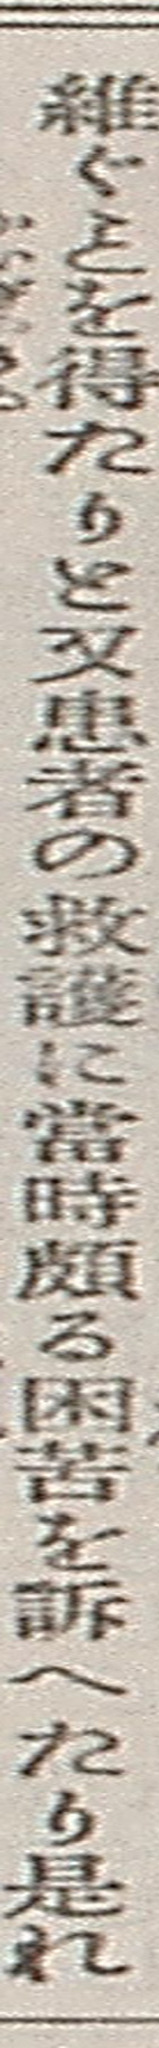維ぐことを得たりと又患者の救護に当時頗る困苦を訴へたり是れ
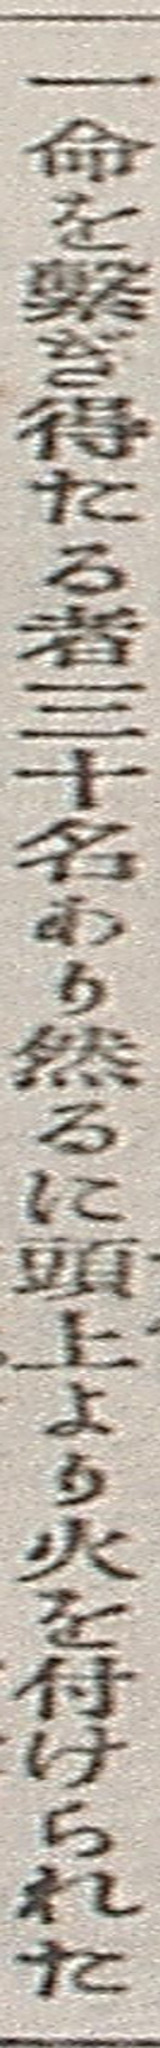一命を繋ぎ得たる者三十名あり然るに頭上より火を付けられた
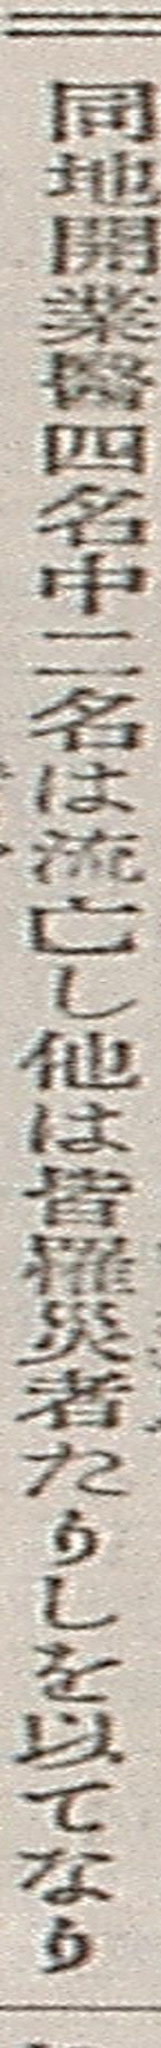同地開業医四名中二名は流亡し他は皆罹災者たりしを以てなり
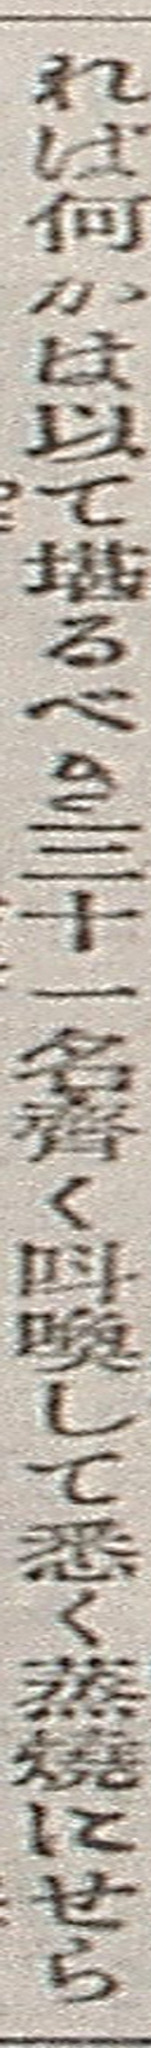れば何かは以て堪るべき三十一名齊く叫喚して悉く蒸焼にせら
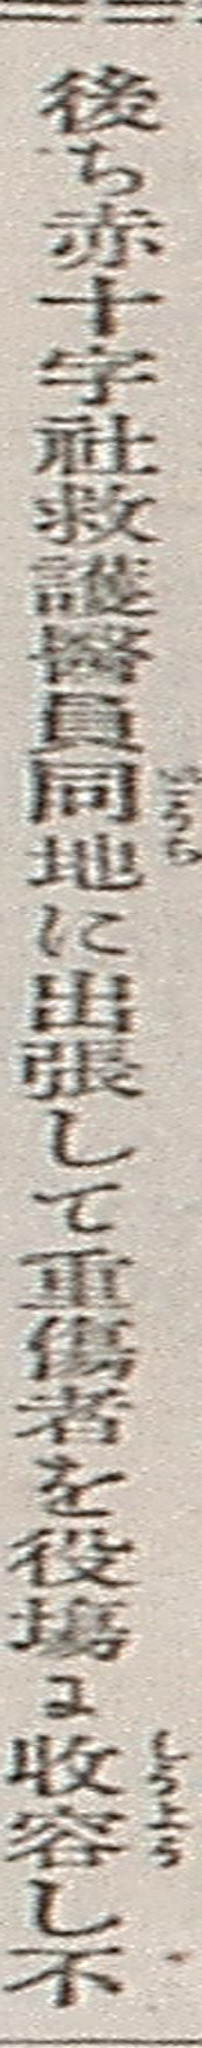後ち赤十字社救護医員同地に出張して重症者を役場に収容し不
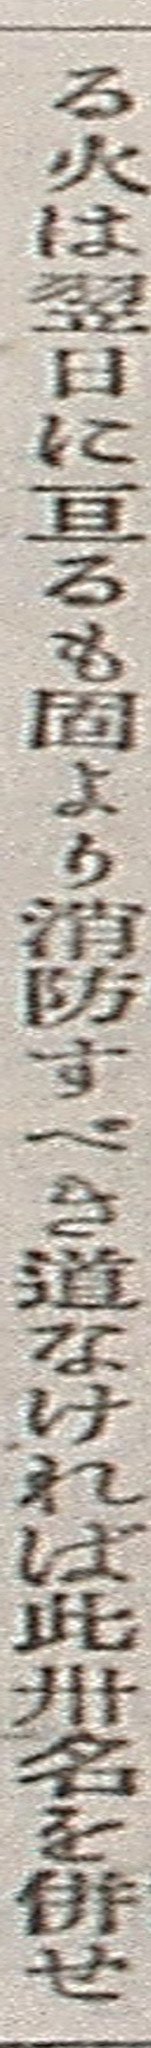る火は翌日に亘るも固より消防すべき道なければ此卅名を併せ

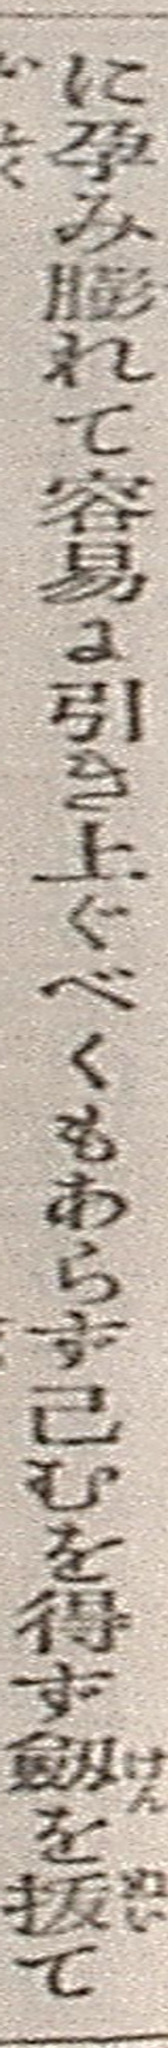に孕み膨れて容易に引き上ぐべくもあらず己むを得ず剣を抜て
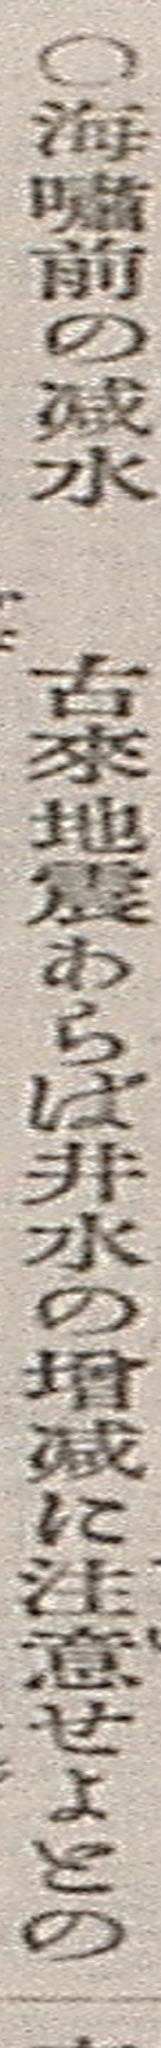○海嘯前の減水古来地震あらば井水の増減に注意せよとの
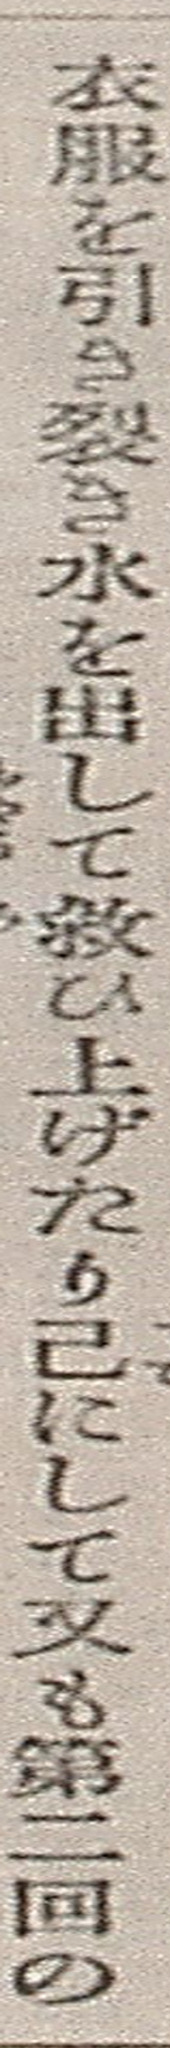衣服を引き裂き水を出して救ひ上げたり己にして又も第二回の
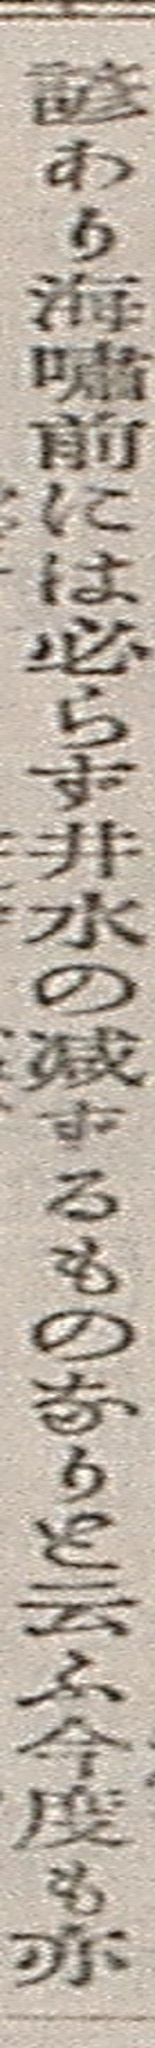諺あり海嘯前には必らず井水の減ずるものなりと云ふ今度も亦
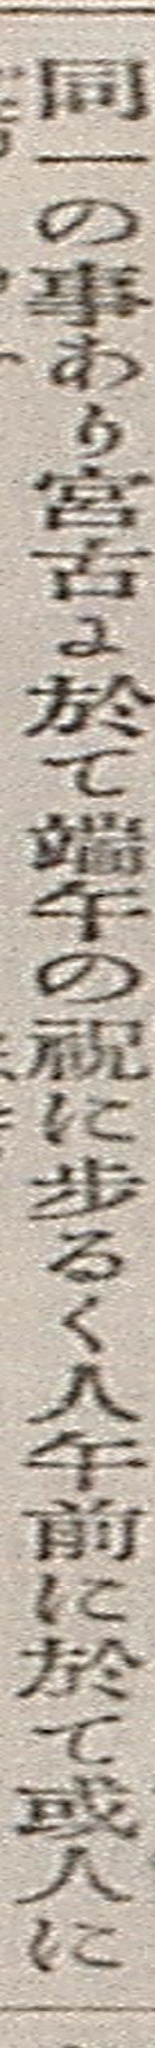同一の事あり宮古に於て端午の祝に歩るく人午前に於て或人に
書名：風俗畫報臨時増刊第百十九號　大海嘯被害録（中）
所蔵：東京大学地震研究所図書室 Earthquake Research Institute Library, The University of Tokyo, JAPAN
